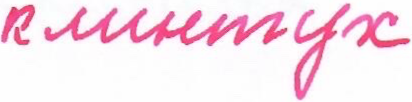клинтух
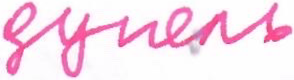дупель
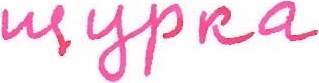щурка
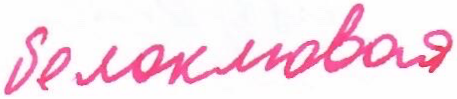белоклювая
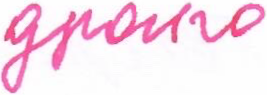дронго
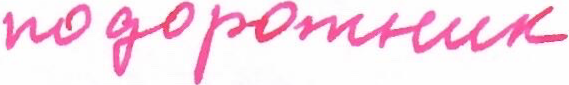подорожник
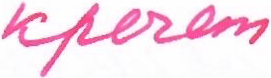кречет
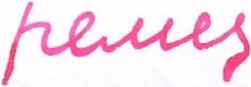ремез
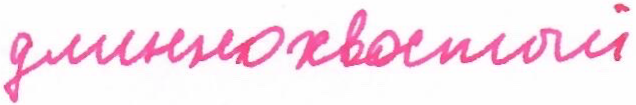длиннохвостый
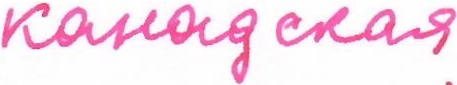канадская
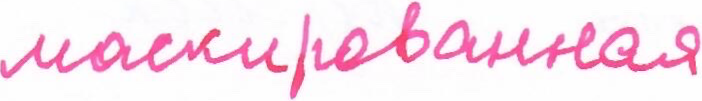маскированная
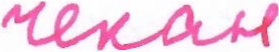чекан
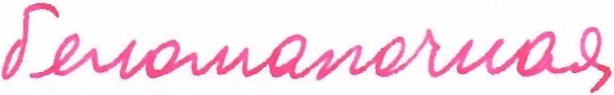белошапочная
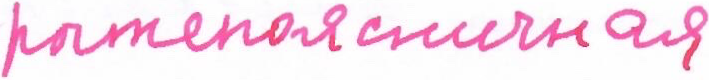рыжепоясничная
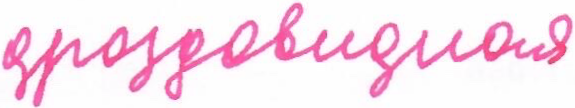дроздовидная
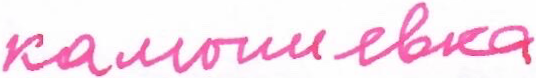камышевка
